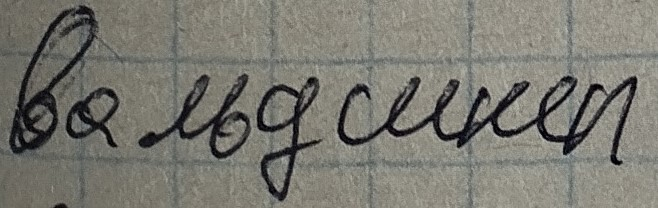вальдшнеп
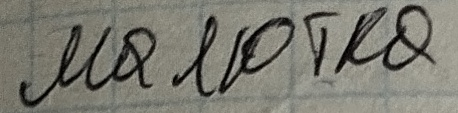малютка
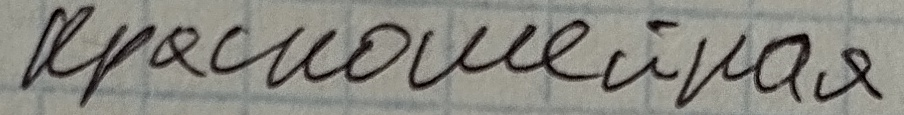красношейная
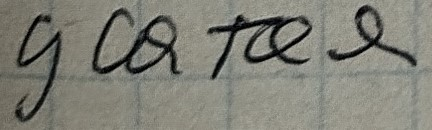усатая
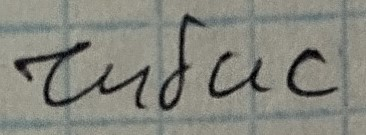чибис
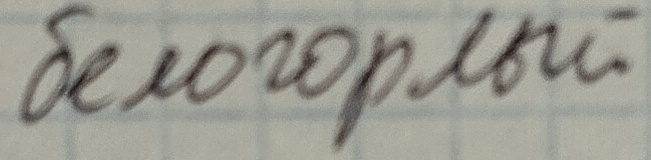белогорлый
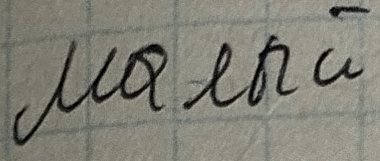малый
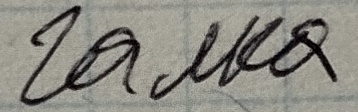галка
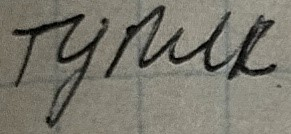тупик
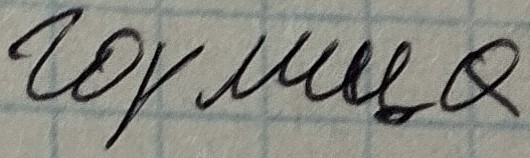горлица
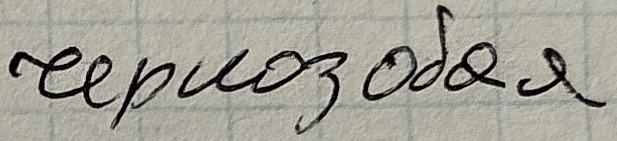чернозобая
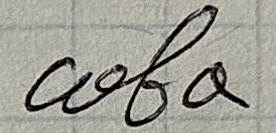сова
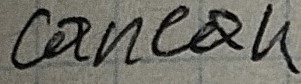сапсан
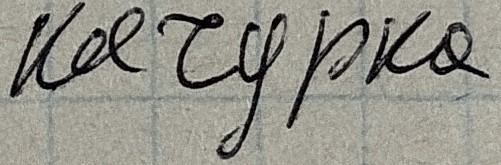качурка
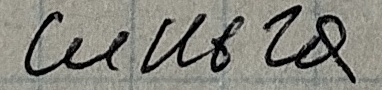синьга
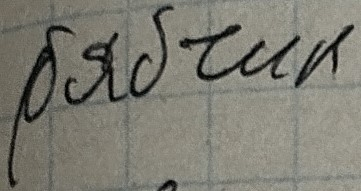рябчик
